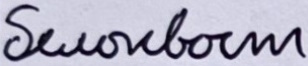белохвост
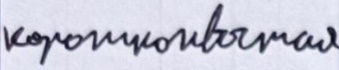короткохвостая
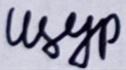щур
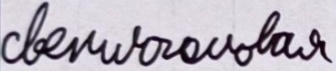светлоголовая
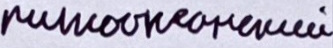тихоокеанский
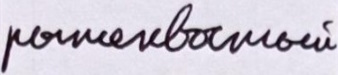рыжехвостый
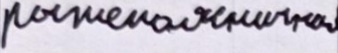рыжепояснична
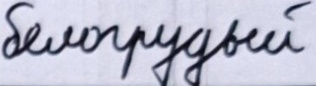белогрудый
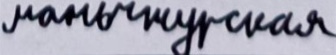маньчжурская
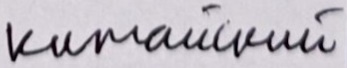китайский
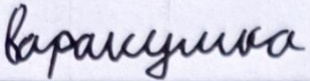варакушка
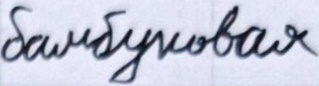бамбуковая
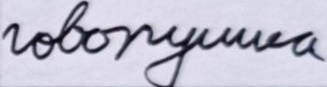говорушка
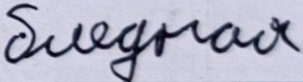бледная
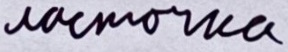ласточка
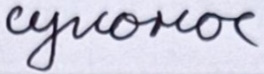сухонос
